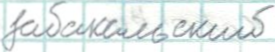забакальский
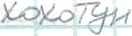хохотун
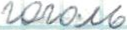гоголь
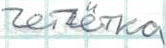чечётка
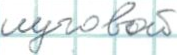луговой
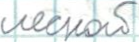лесной
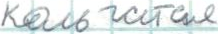кольчатая
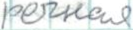речная
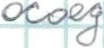осоед
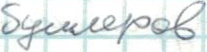буллеров
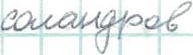соландров
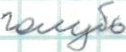голубь
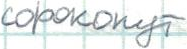сорокопут
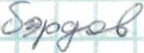бэрдов
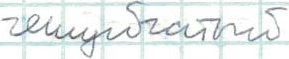чешуйчатый
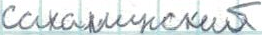сахалинский
